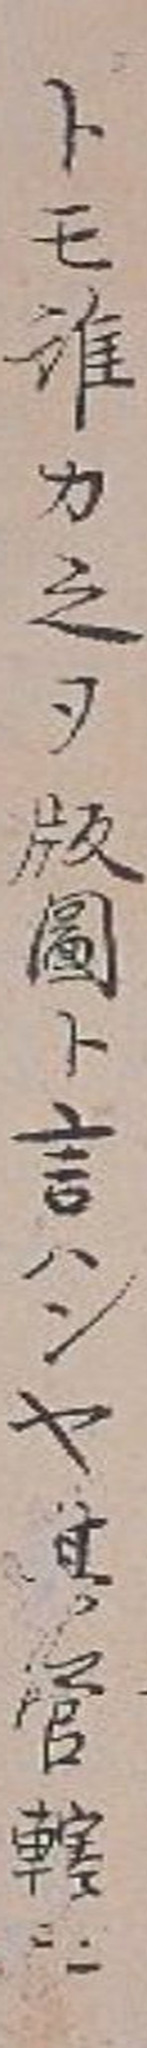トモ誰カ之ヲ版図ト言ハンヤ其管轄モ
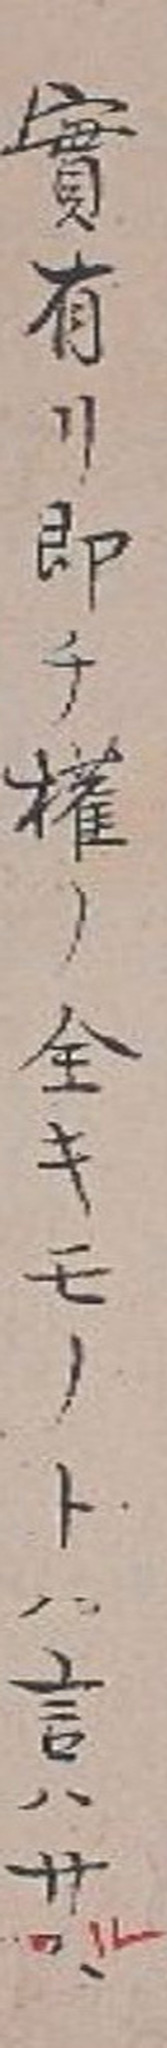実有リ即チ権ノ全キモノトハ言ハサル、
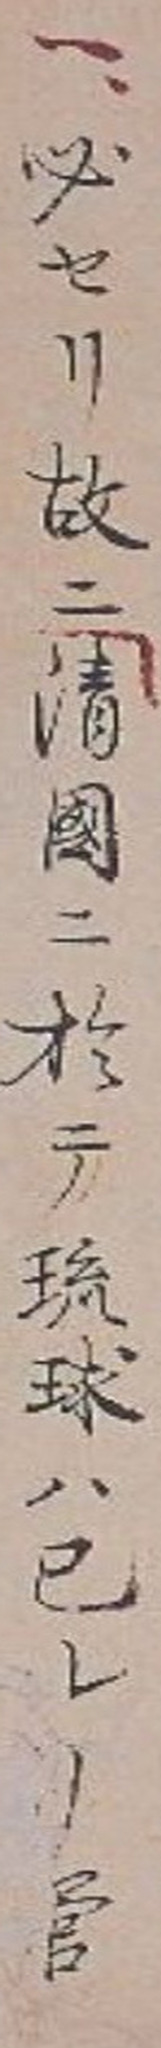一、必セリ故ニ「清国ニ於テ琉球ハ己レノ管
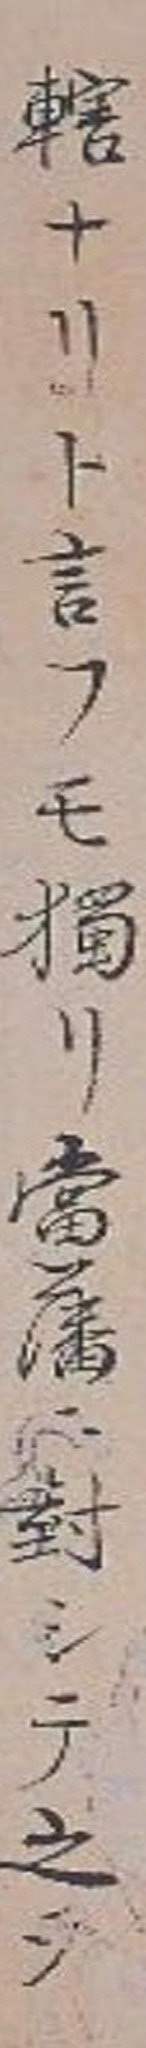轄ナリト言フモ独リ当藩ニ対シテ之ヲ
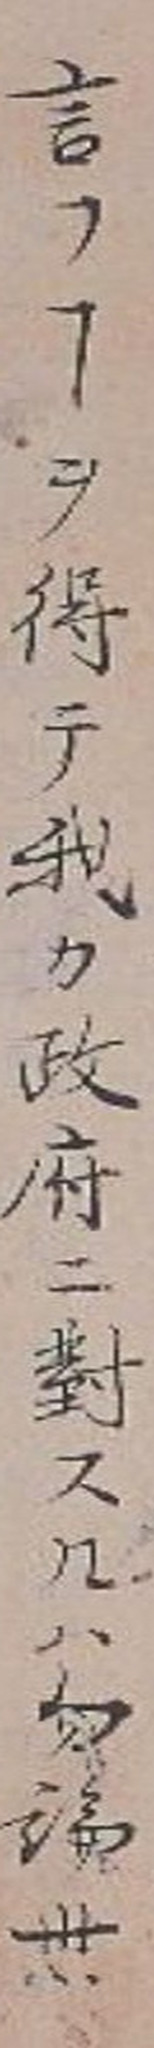言フコトヲ得テ我カ政府ニ対スルニ勿論世
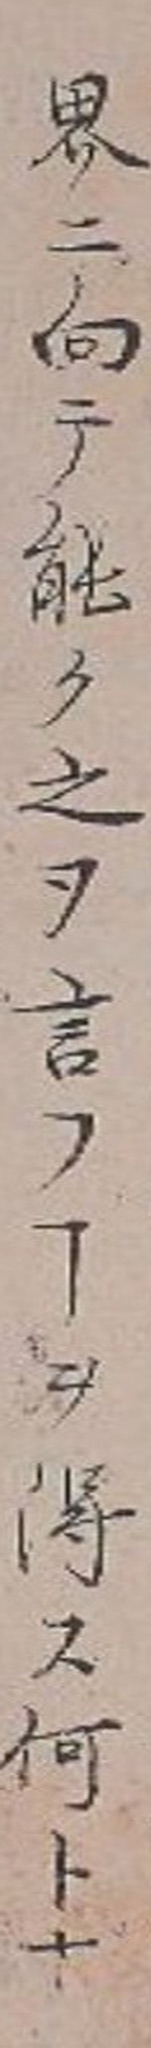界ニ向テ能ク之ヲ言フコトヲ得ス何トナ
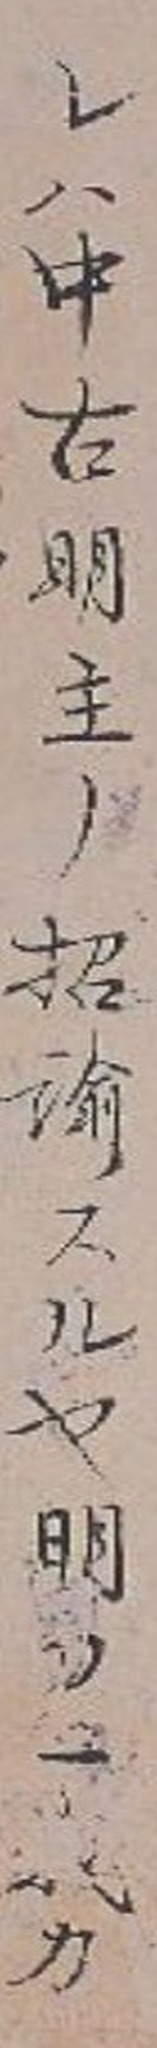レハ中古明主ノ招諭スルヤ明カニ我カ
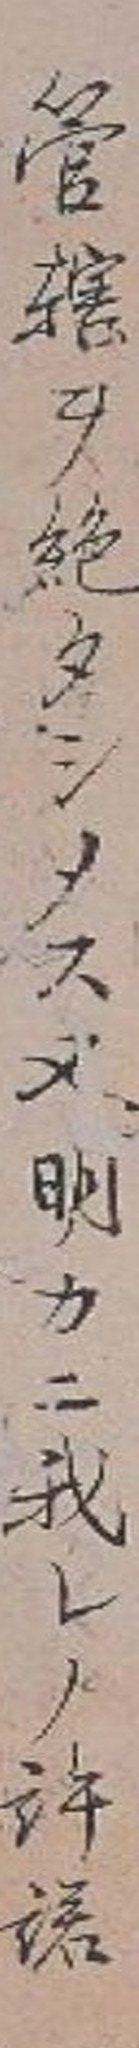管轄ヲ絶タシメス又明カニ我レノ許諾

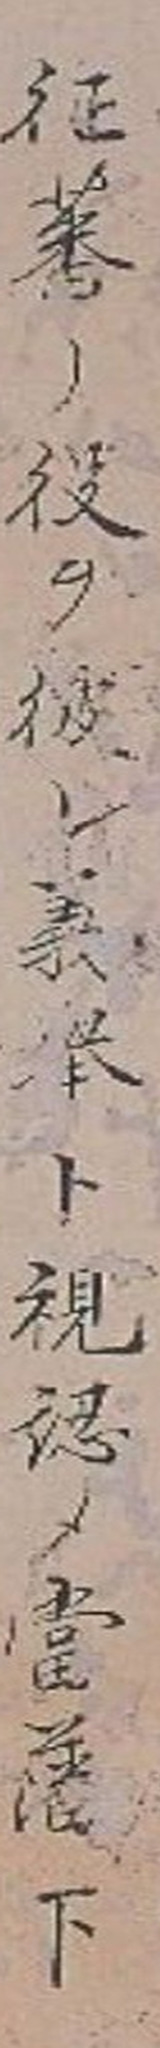征蕃ノ役ヲ彼レ義挙ト視認メ当藩下
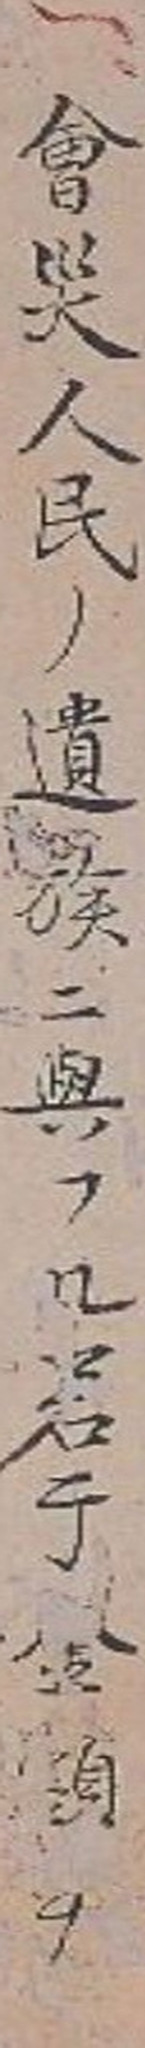一、会災人民ノ遺族ニ与フル若干金額ヲ
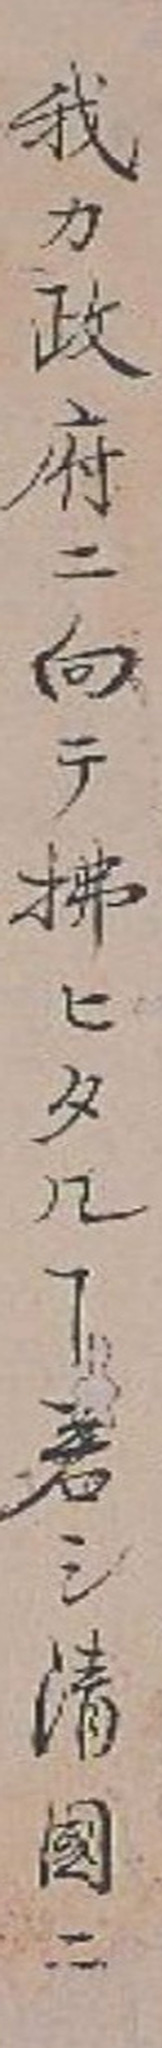我カ政府ニ向テ払ヒタルコト若シ清国ニ
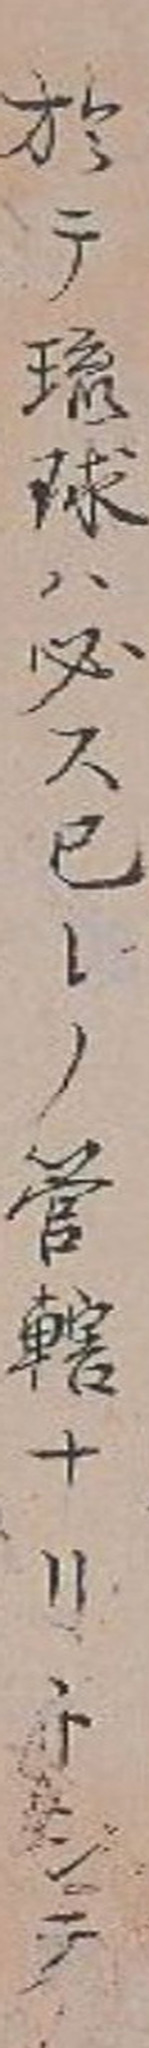於テ琉球ハ必ス己レノ管轄ナリトシテ
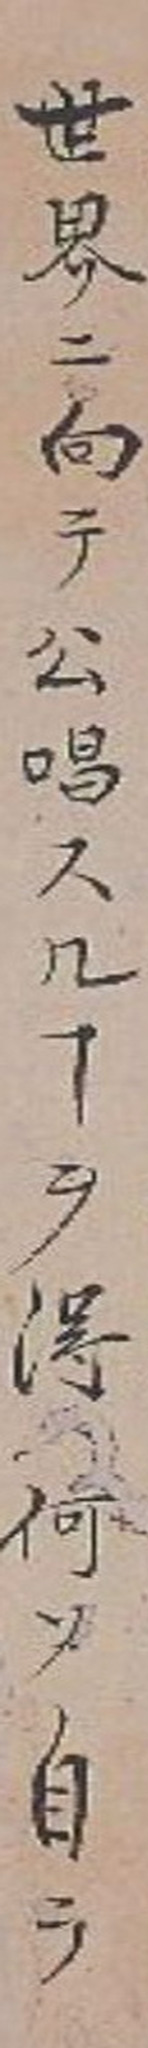世界ニ向テ公唱スルコトヲ得何ソ自ラ
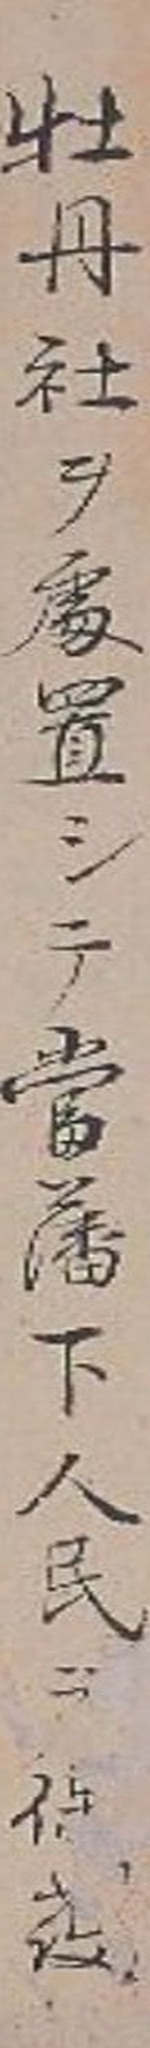牡丹社を処置シテ当藩下人民ヲ保護
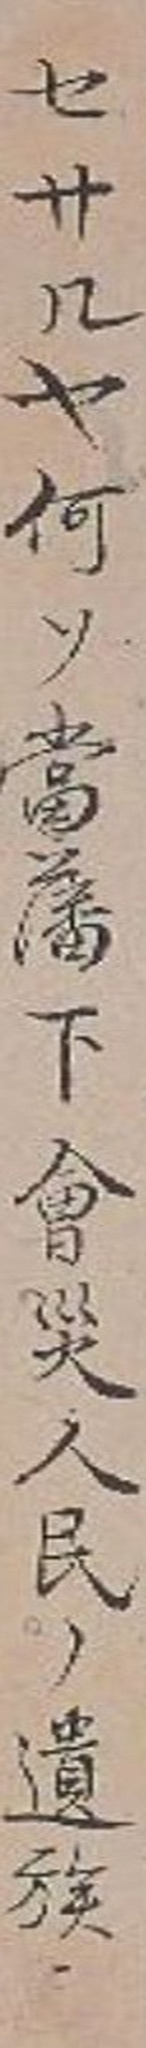セサルヤ何ソ当藩下会災人民ノ遺族
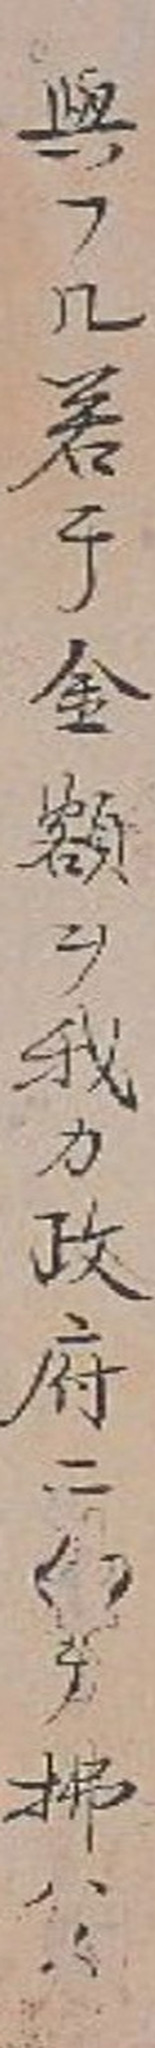与フル若干金額ヲ我カ政府ニ向テ払ハス
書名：奉使琉球始末 草稿之一部
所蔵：University of the Ryukyus Library
